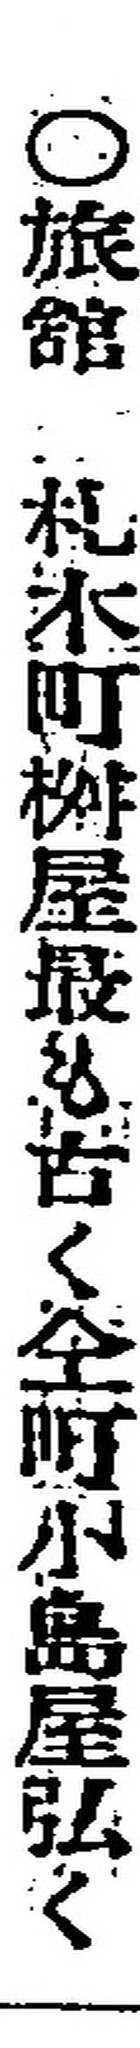○旅舘札木町桝屋最も古く仝町小島屋弘く
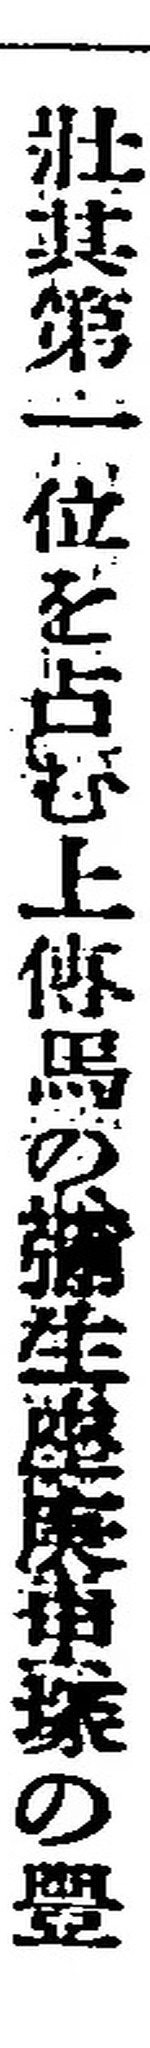壮其第一位を占む上伝馬の弥生座庚申塚の豊
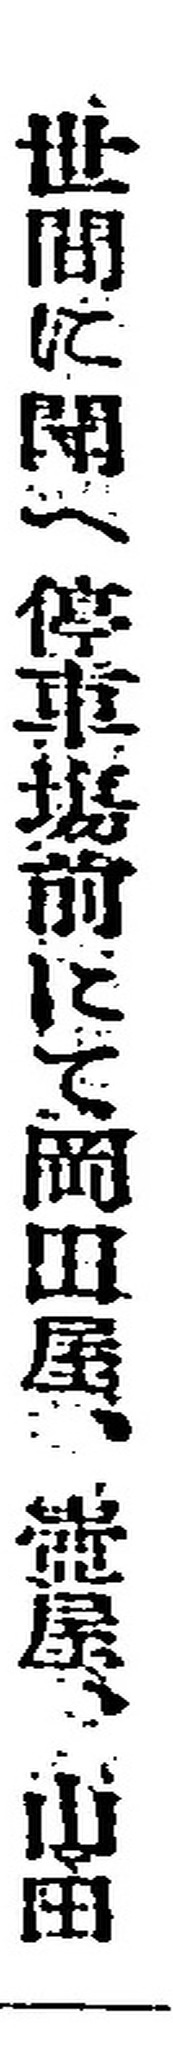世間に聞へ停車場前にて岡田屋、壺屋、山田
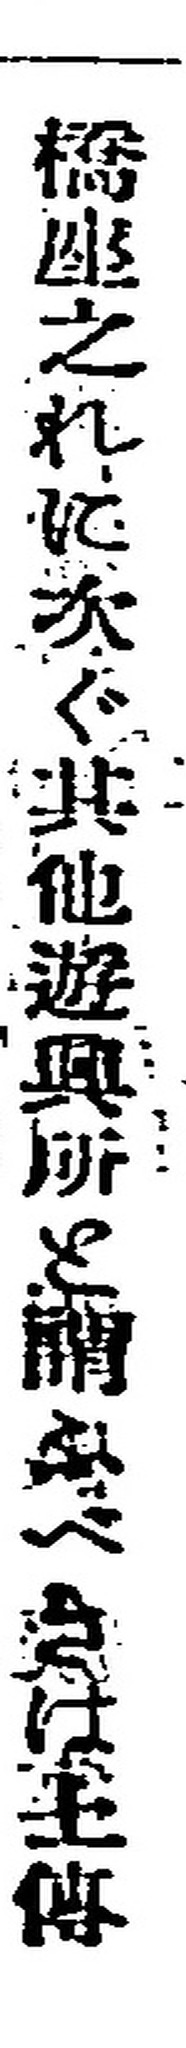橋座之れに次ぐ其他遊興所と謂ふべきは上伝
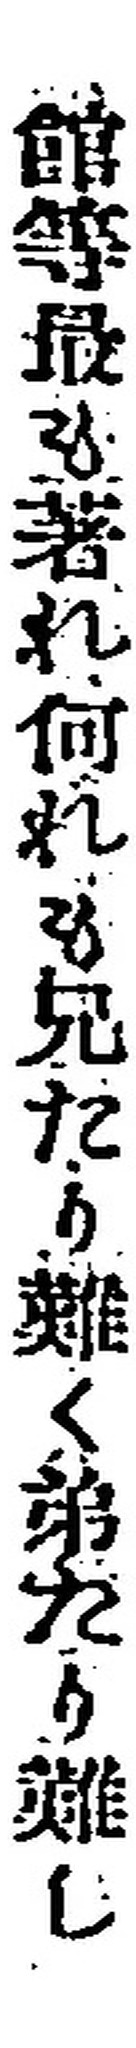館等最も著れ何れも兄たり難く弟たり難し
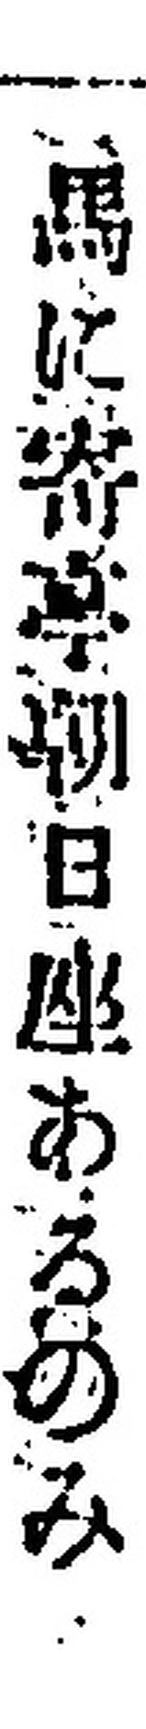馬に寄亭朝日座あるのみ
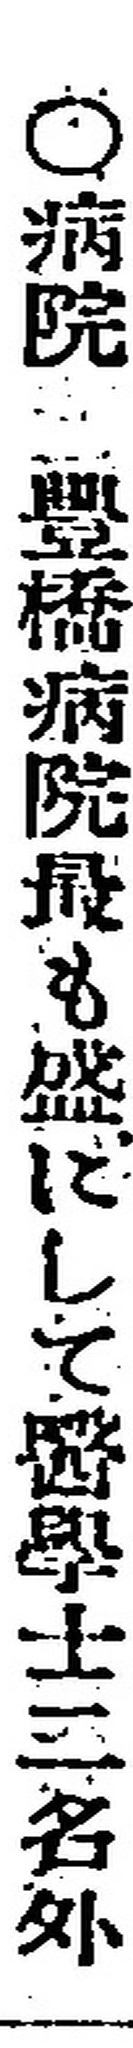○病院豊橋病院最も盛にして医学士二名外
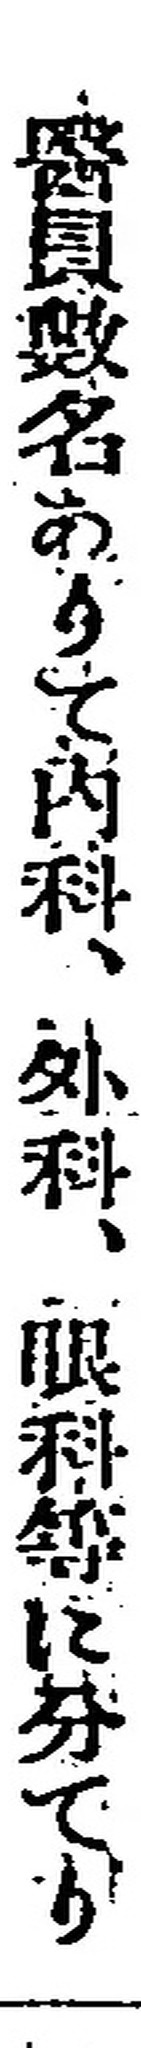医員数名ありて内科、外科、眼科等に分てり
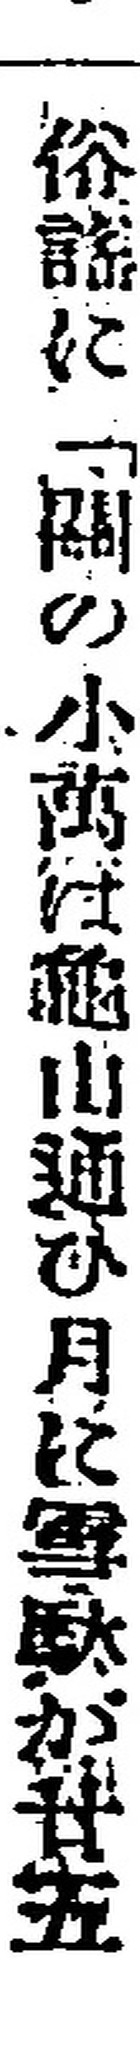俗謡に「関の小万は亀山通ひ月に雪駄が廿五
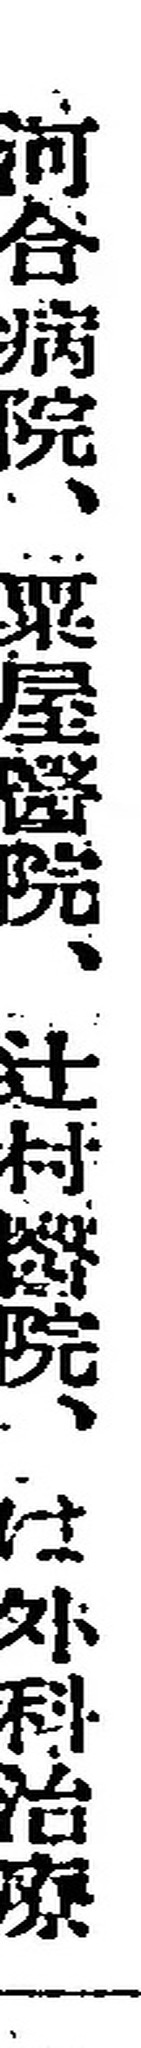河合病院、粟屋医院、辻村医院、は外科治療
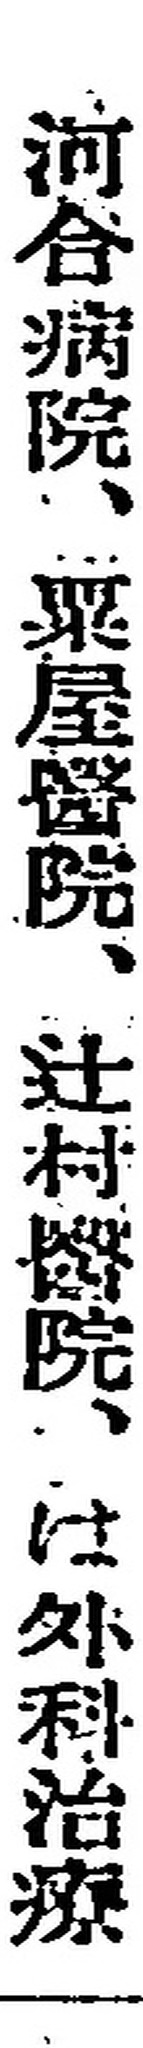河合病院、粟屋医院、辻村医院、は外科治療
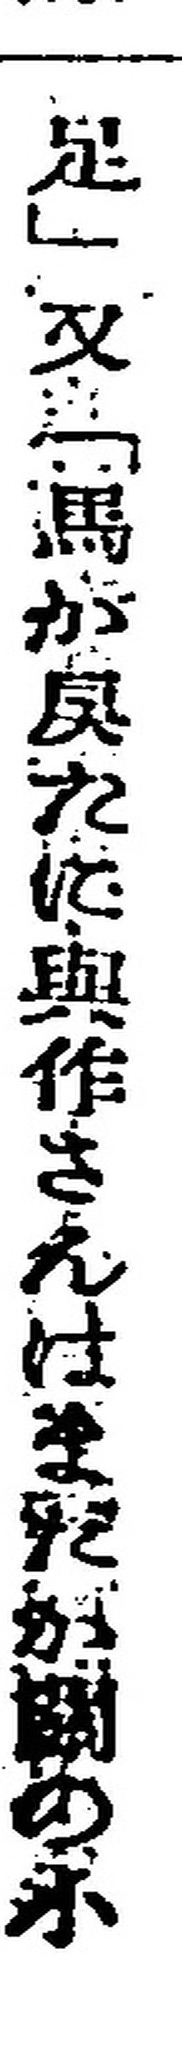足」又「馬が戻たに与作さんはまだか関の小
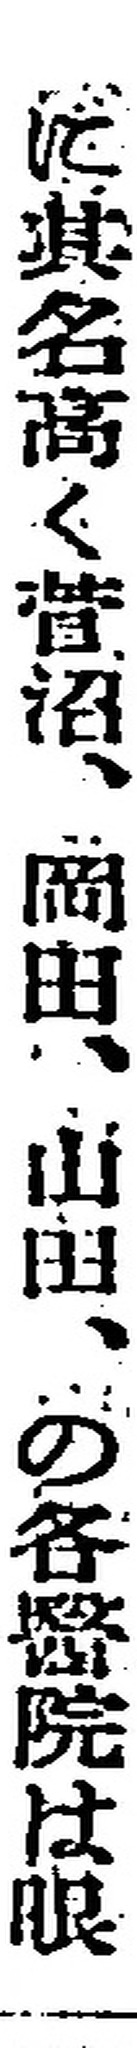に其名高く菅沼、岡田、山田、の各医院は眼
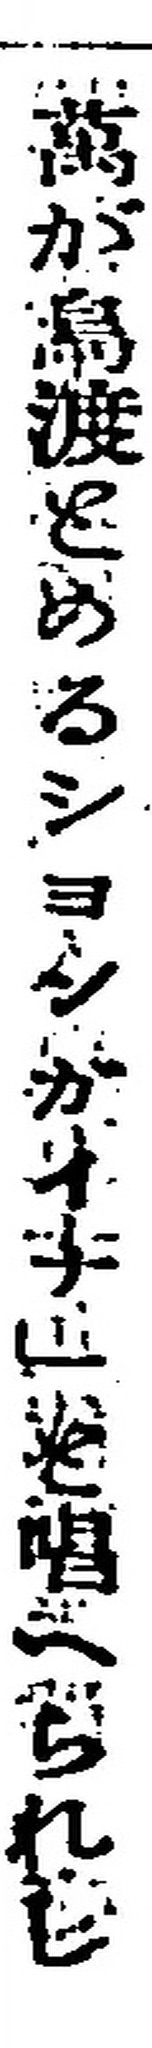万が鳥渡とめるシヨンガイナ」と唱へられし
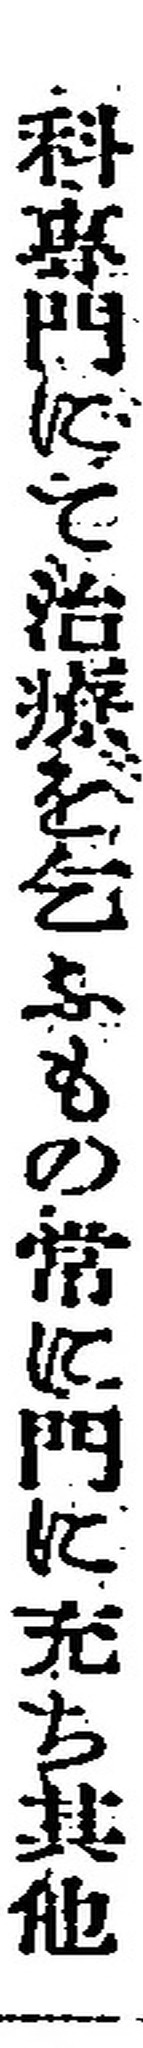科専門にて治療を乞ふもの常に門に充ち其他
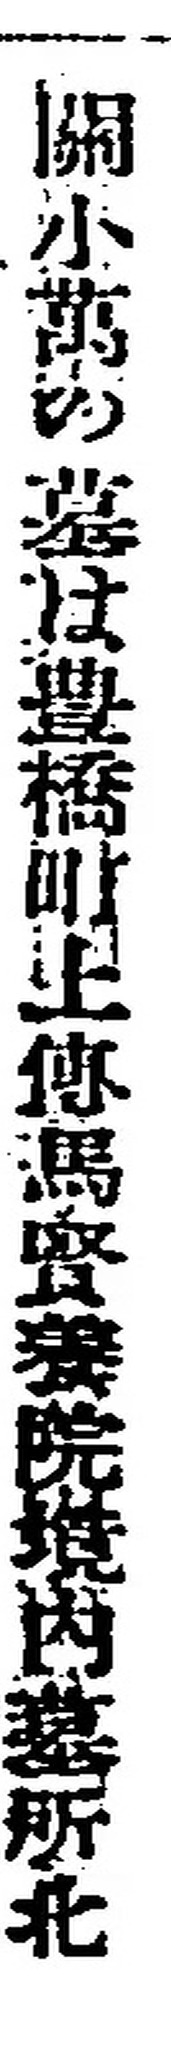関小万の墓は豊橋町上伝馬賢養院境内墓所北
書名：東参名勝案内
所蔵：国立国会図書館 National Diet Library, JAPAN
